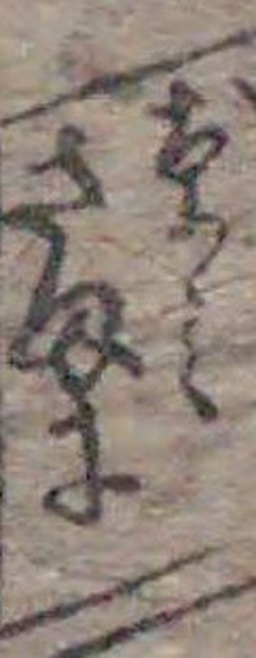さまに
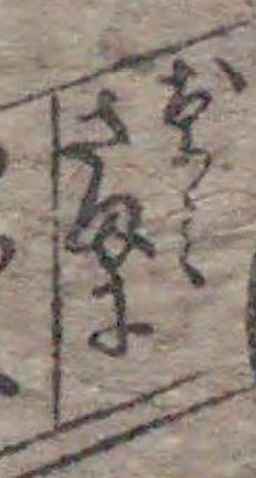さまに
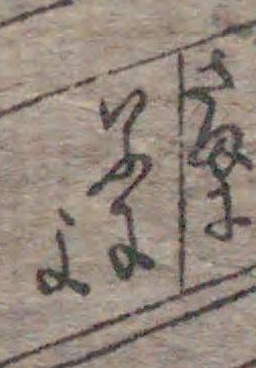いふに
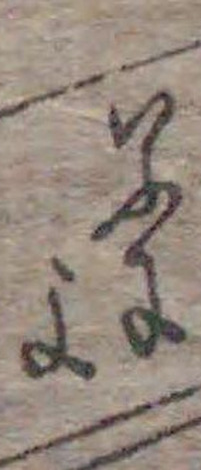いふに
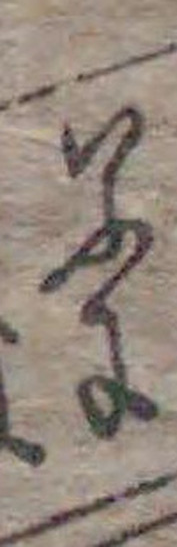いふに
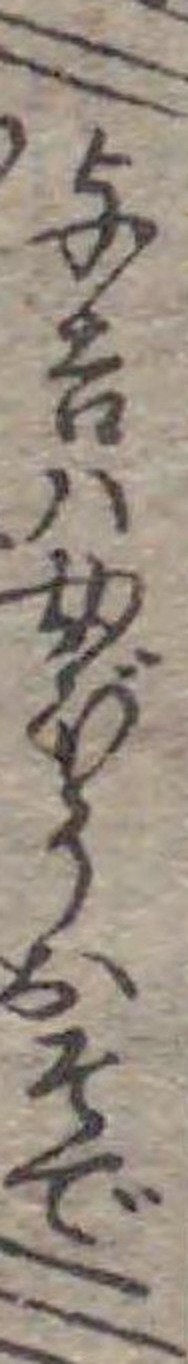与吉は女ぼうおそで
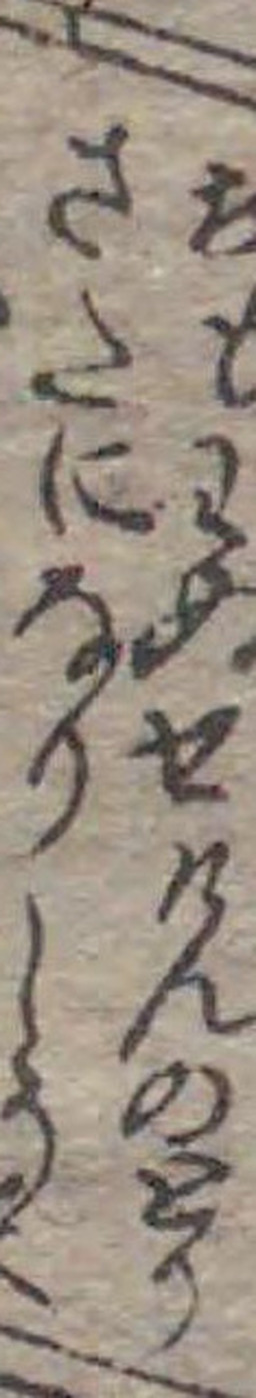さたになりしうと
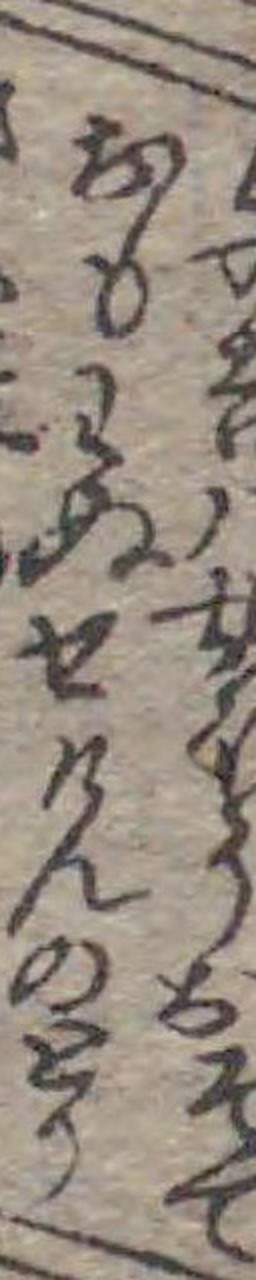おもはぬせけんのとり
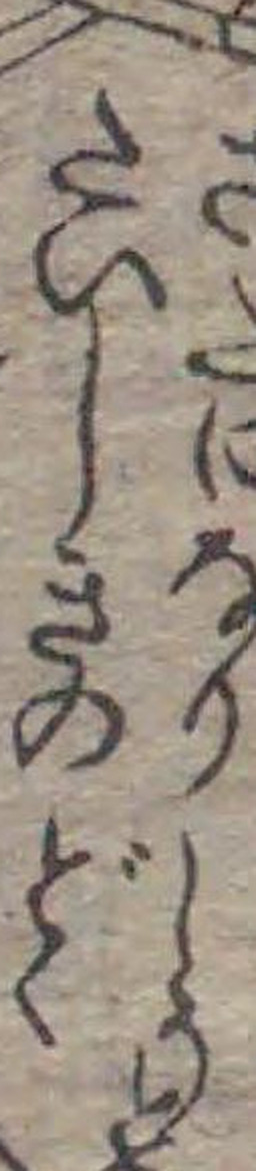たひしきのどく
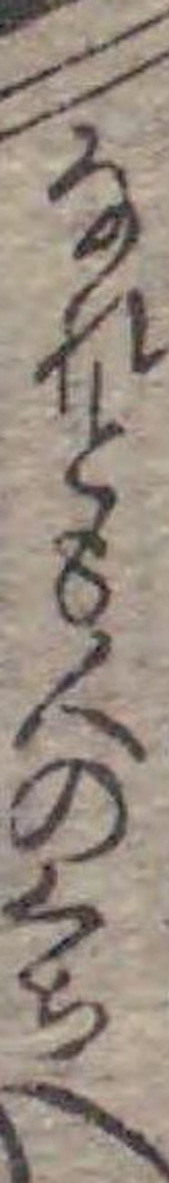なれとも人のくち
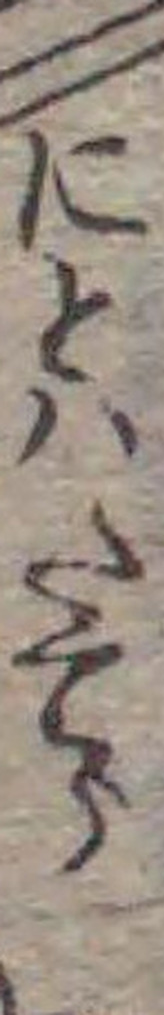にとはたてら
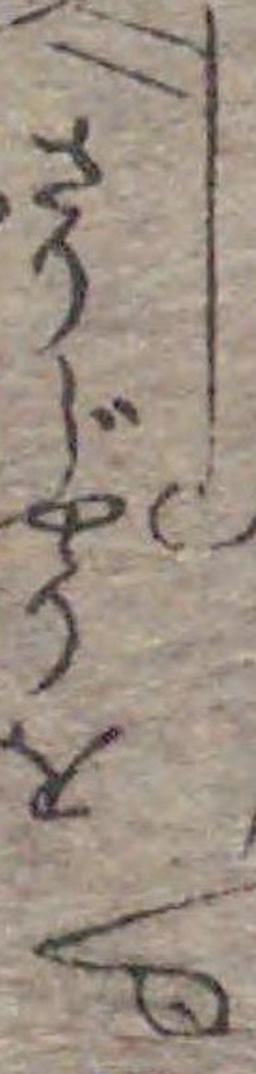さりじやうを
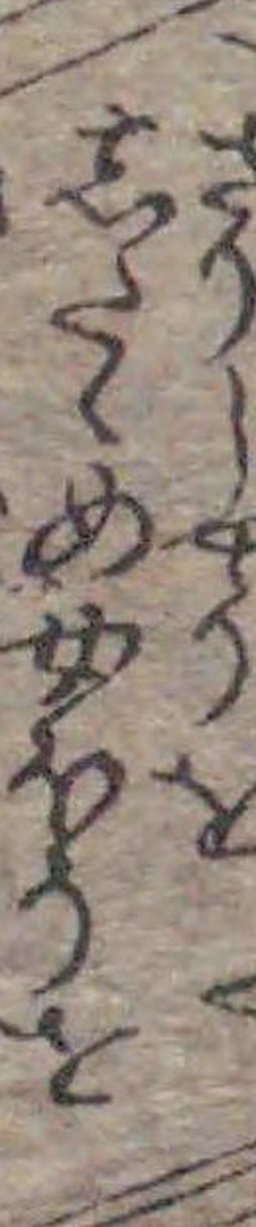したゝめ女ほうを
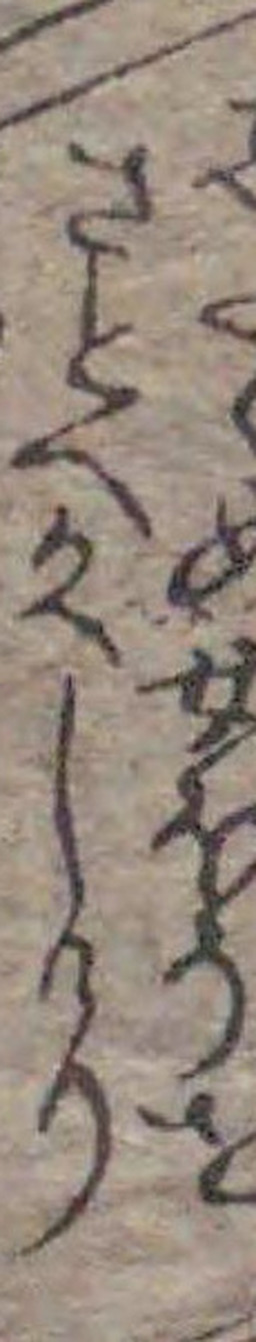さとへかへしけり
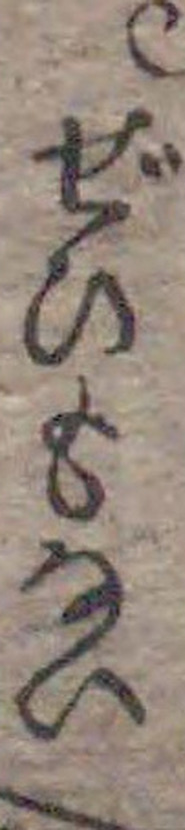ぜひもない
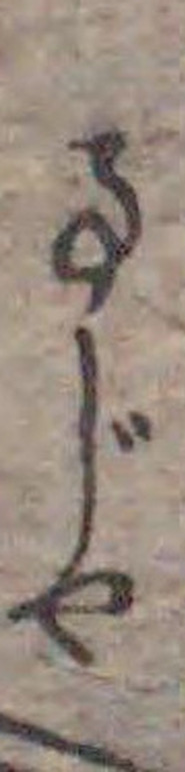事じや
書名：神田与吉一代記 : 3巻
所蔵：国立国会図書館 National Diet Library, JAPAN
